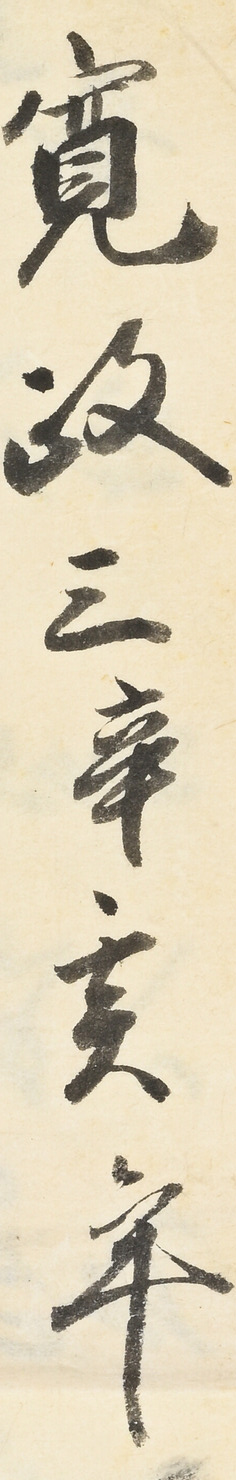寛政三辛亥年
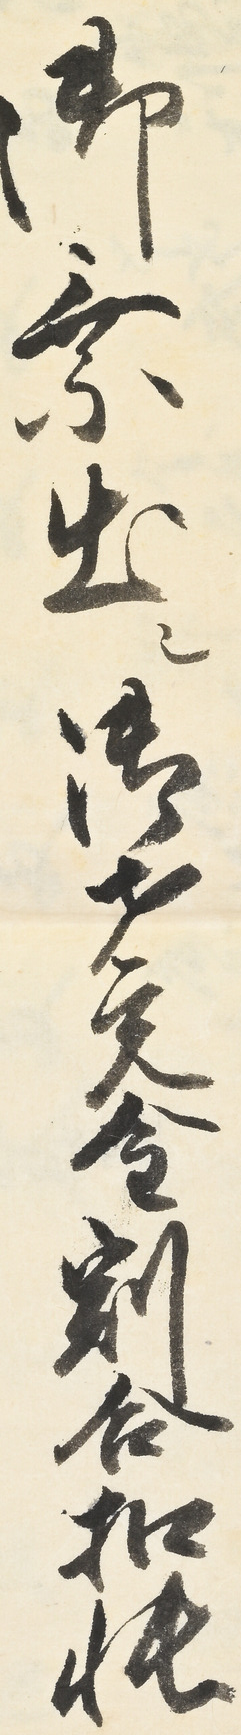御乗出シ御才覚金割合控帳
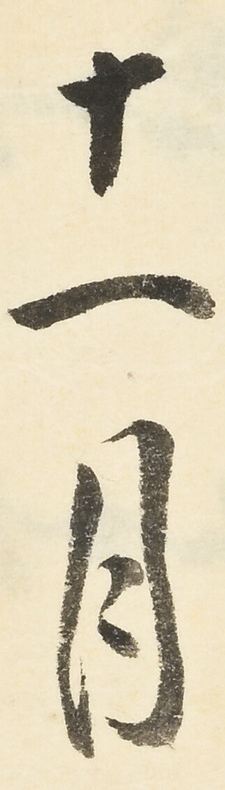十一月

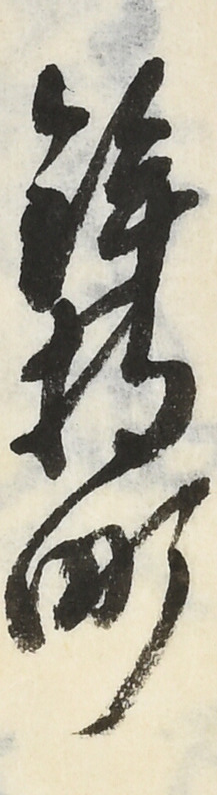鉾持町
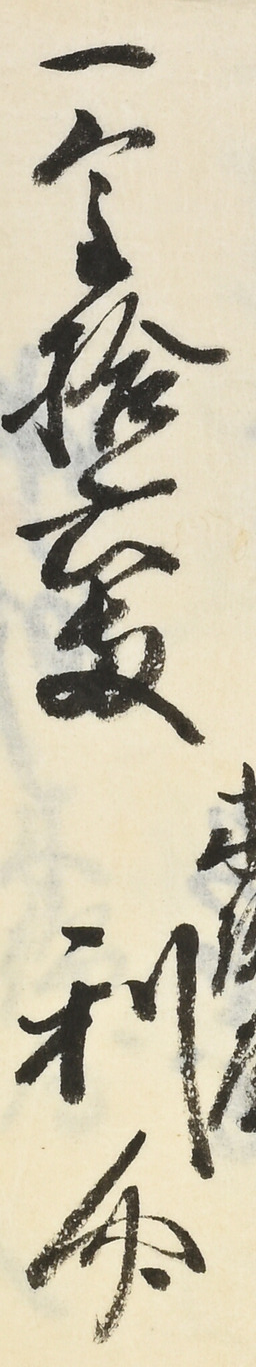一金拾六両利介
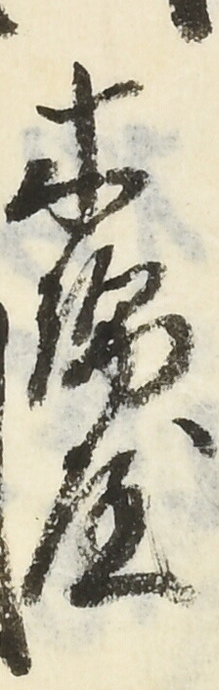木綿屋
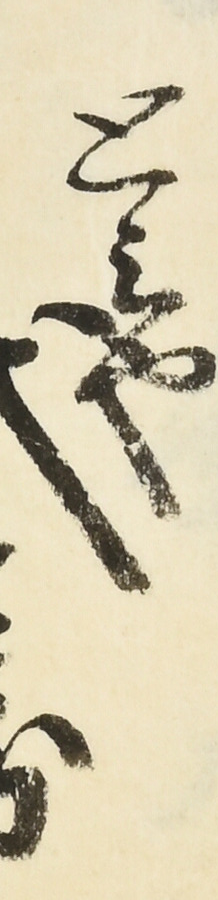とミや
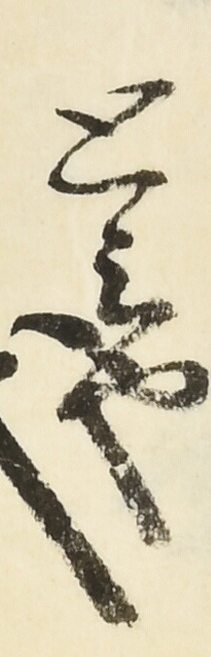とミや

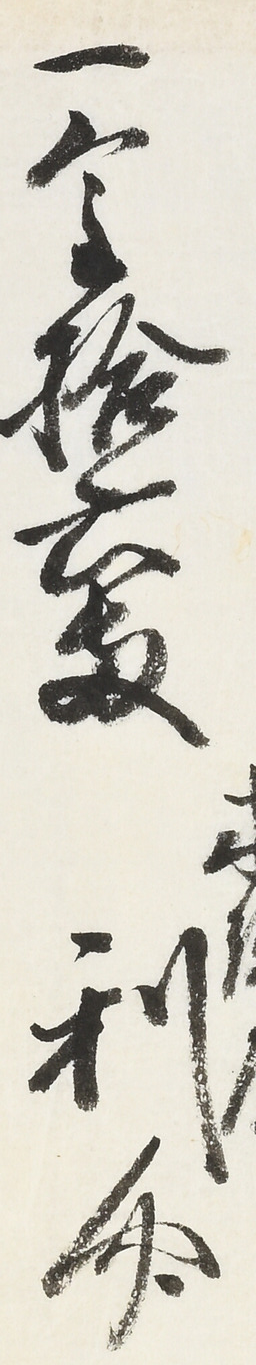一金拾六両利介
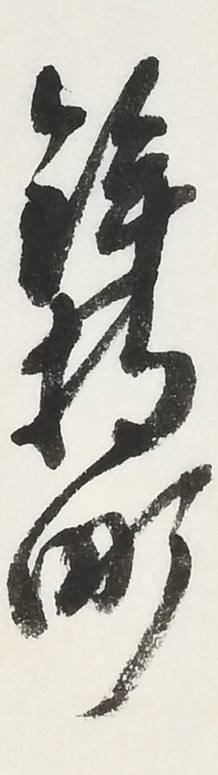鉾持町
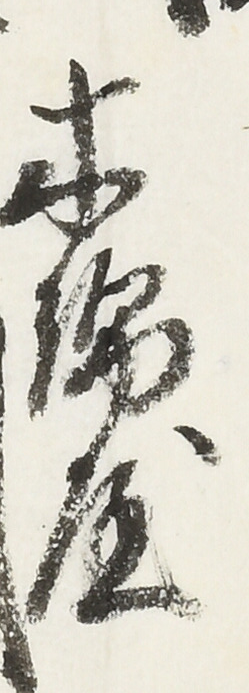木綿屋
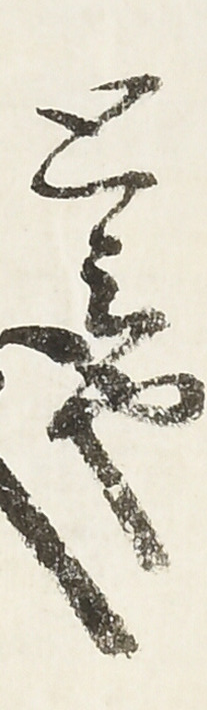とミや
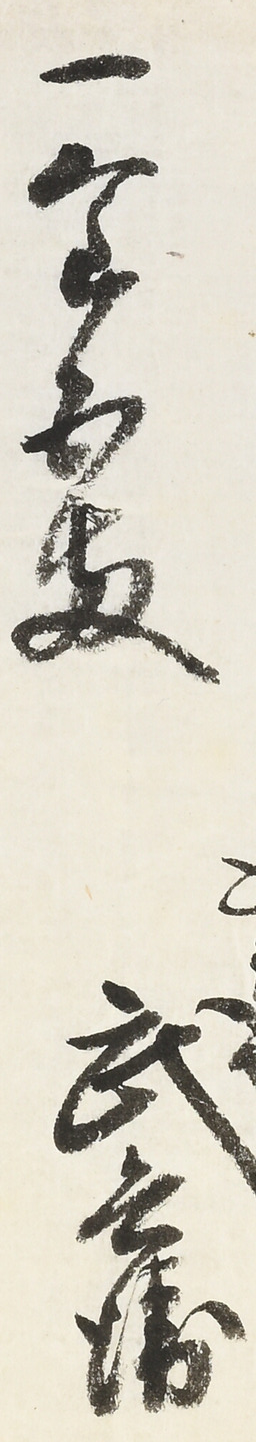一金五両武兵衛
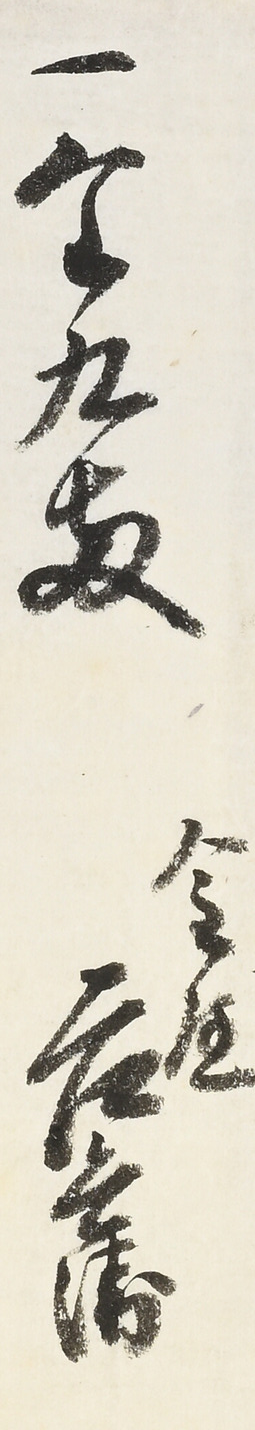一金九両吉兵衛
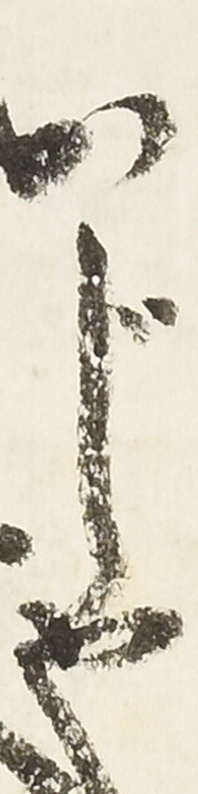かじや
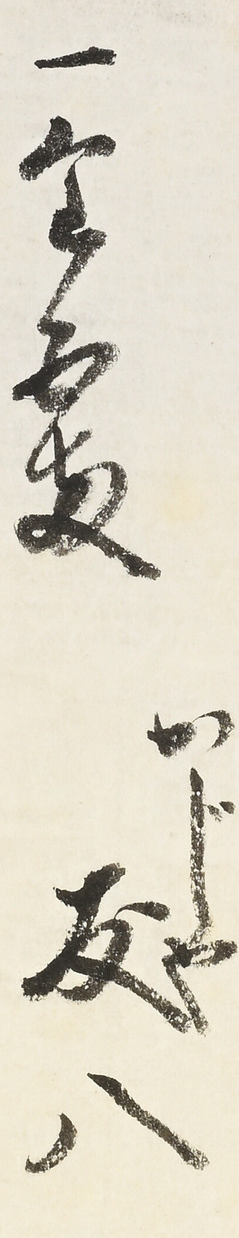一金五両友八
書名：御乗出シ御才覚金割合扣帳
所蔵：伊那市立高遠町図書館・合同会社AMANE
